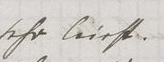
sehr leicht.
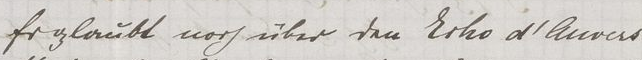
Er glaubt noch über den Echo d'Anvers
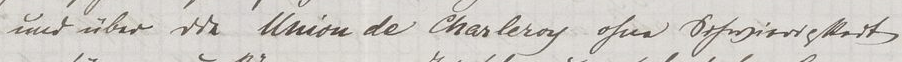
und über die Union de Charleroy ohne Schwierigkeit
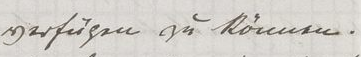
verfügen zu können.
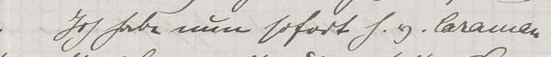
Ich habe nun sofort H. v. Caraman
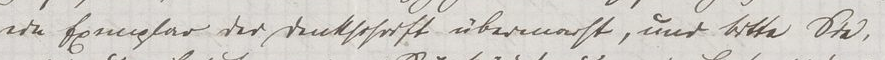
ein Exemplar der Denkschrift übermacht, und bitte Sie,
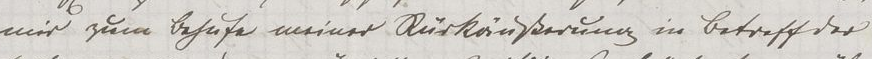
mir zum Behufe meiner Rückäußerung in Betreff der
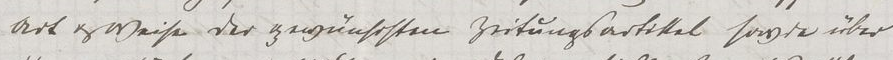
Art & Weise der gewünschten Zeitungsartikel sowie über
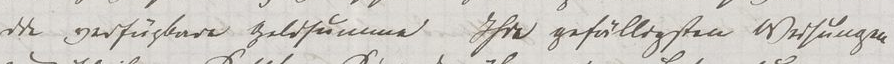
die verfügbare Geldsumme Ihre gefälligsten Weisungen
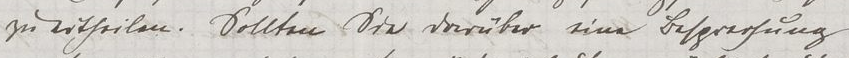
zu ertheilen. Sollten Sie darüber eine Besprechung
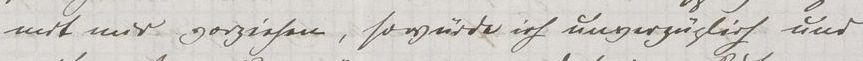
mit mir vorziehen, so würde ich unverzüglich und
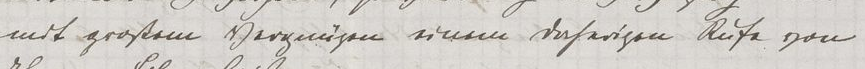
mit großem Vergnügen einem daherigen Rufe von
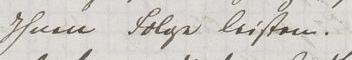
Ihnen Folge leisten.
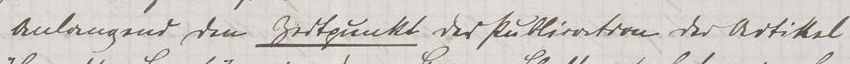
Anlangend den Zeitpunkt der Publication der Artikel
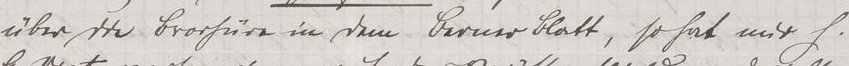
über die Brochüre in dem Berner Blatt, so hat mir H.
